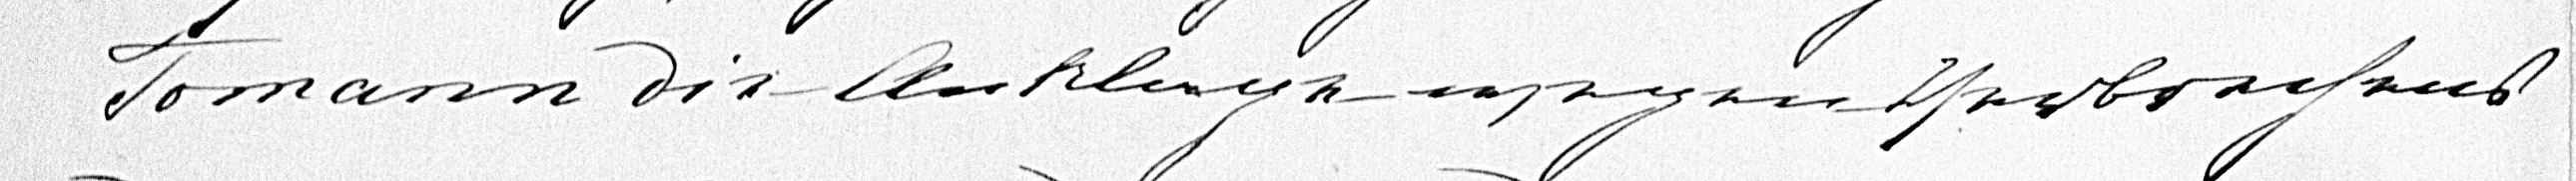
Tomann die Anklage wegen Verbrechens
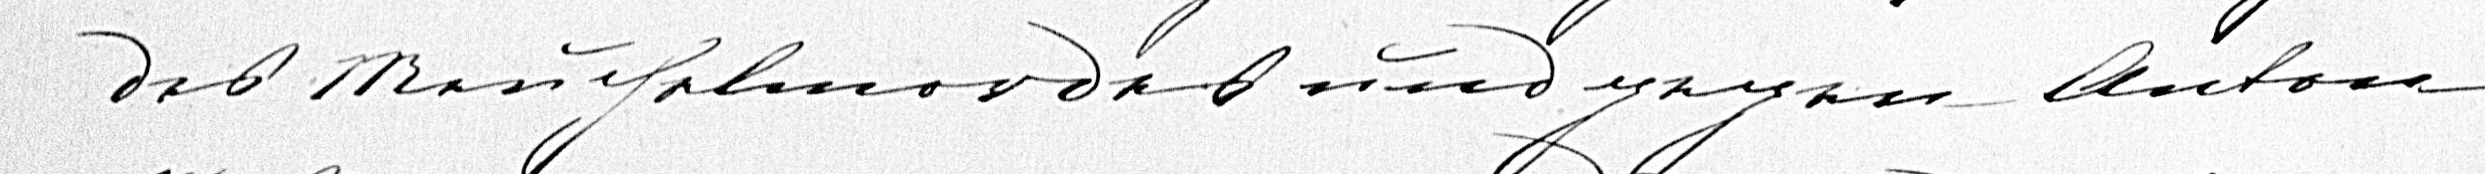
des Meuchelmordes und gegen Anton
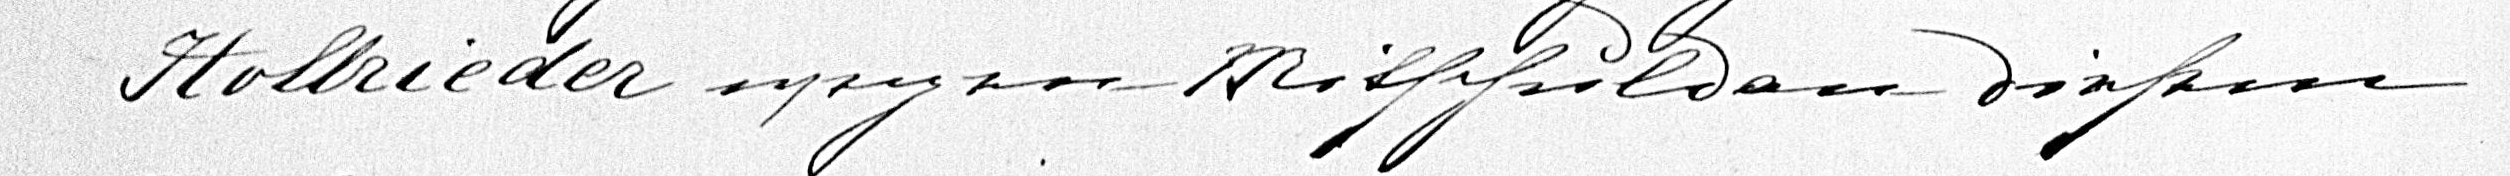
Hollrieder wegen Mitschulden diesem
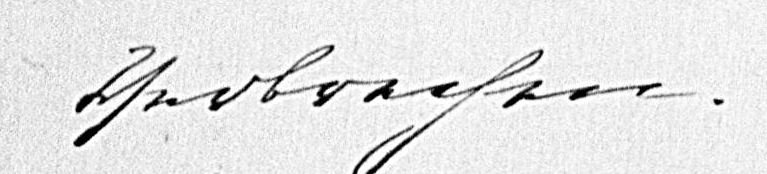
Verbrechen.
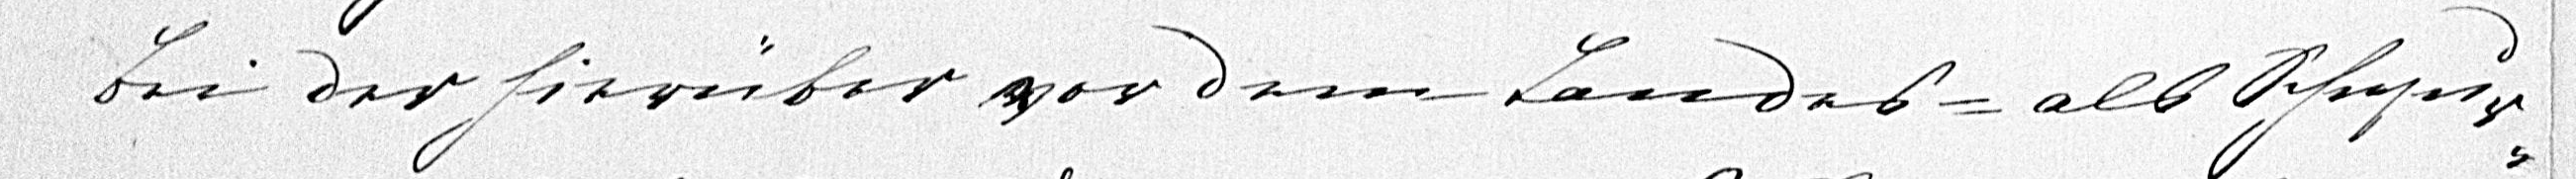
Bei der hierüber vor dem Landes-als Schwur
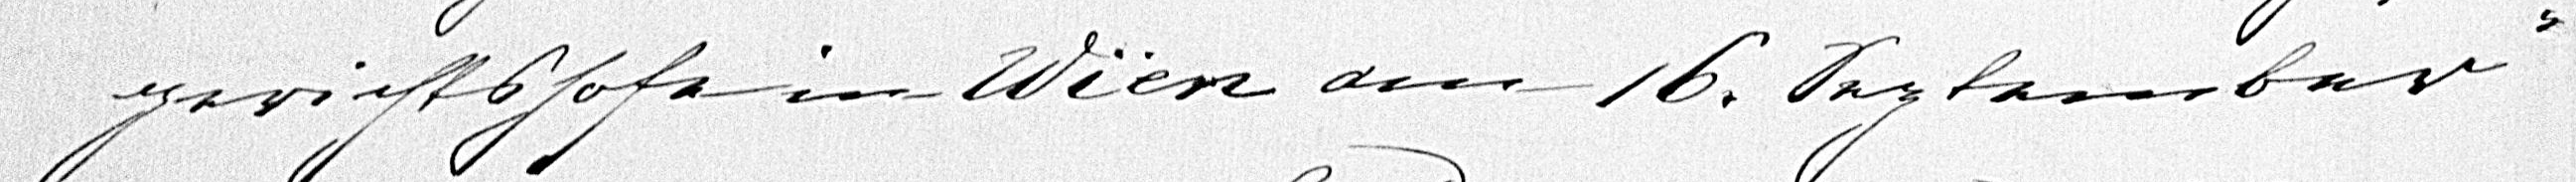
gerichtshofe in Wien am 16. September
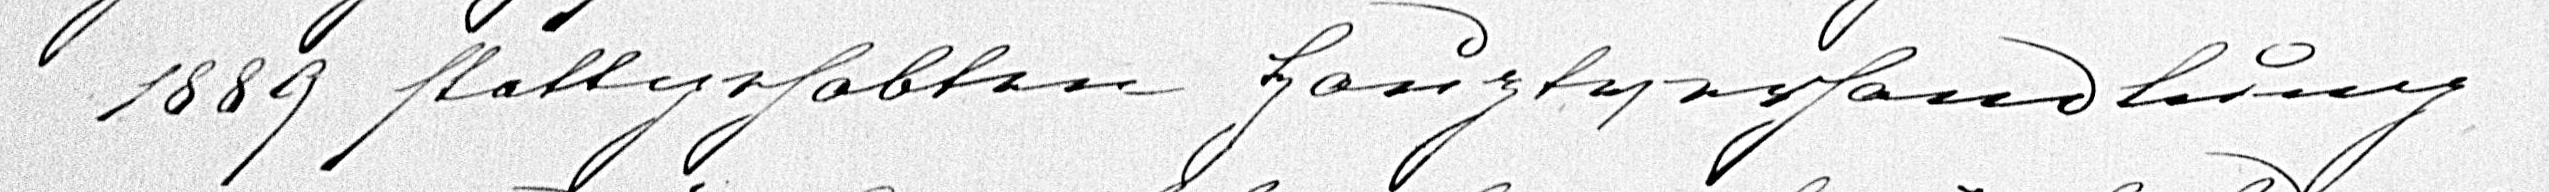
1889 stattgehabten Hauptverhandlung
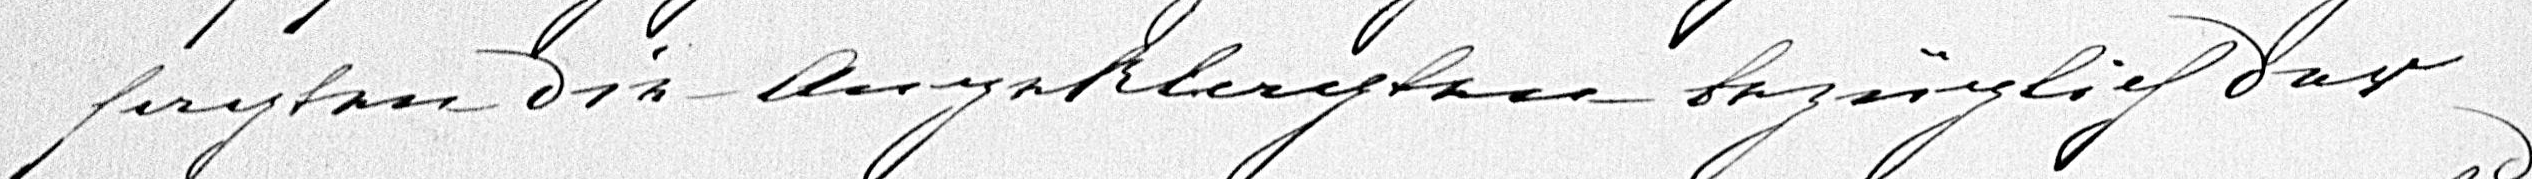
sagten die Angeklagten bezüglich der
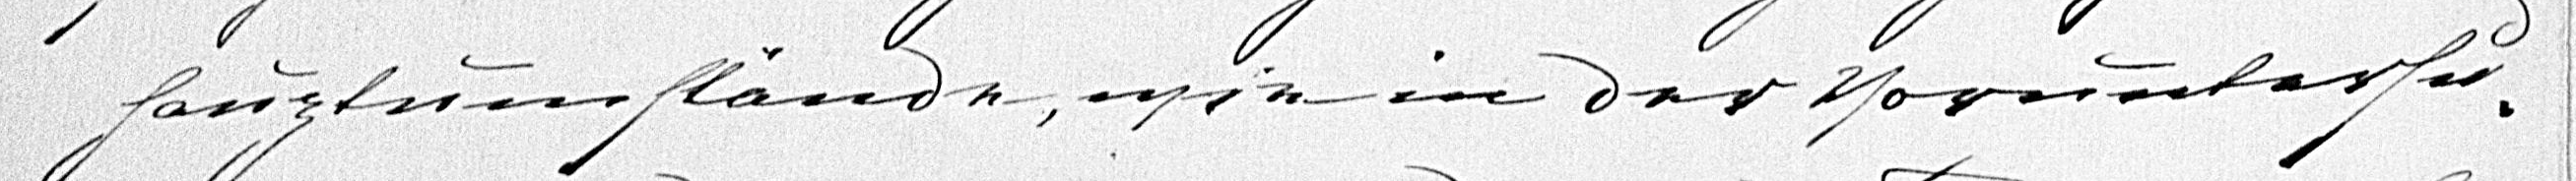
Hauptumstände, wie in der Voruntersu¬
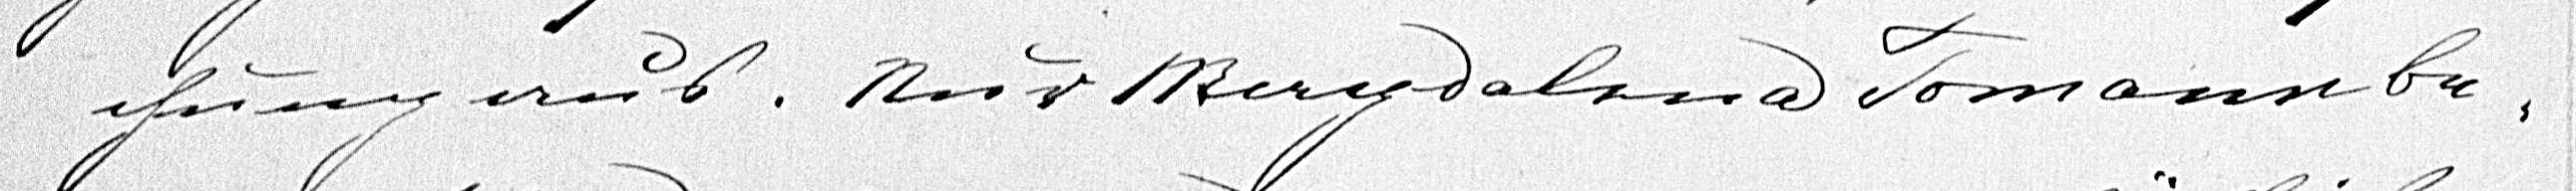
chung aus. Nur Magdalena Tomann be¬
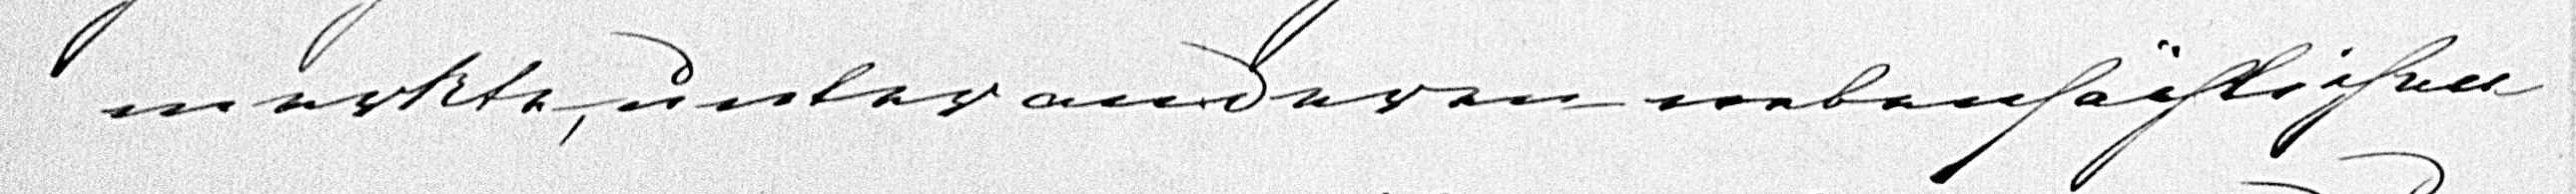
merkte, unter anderen nebensächlichen
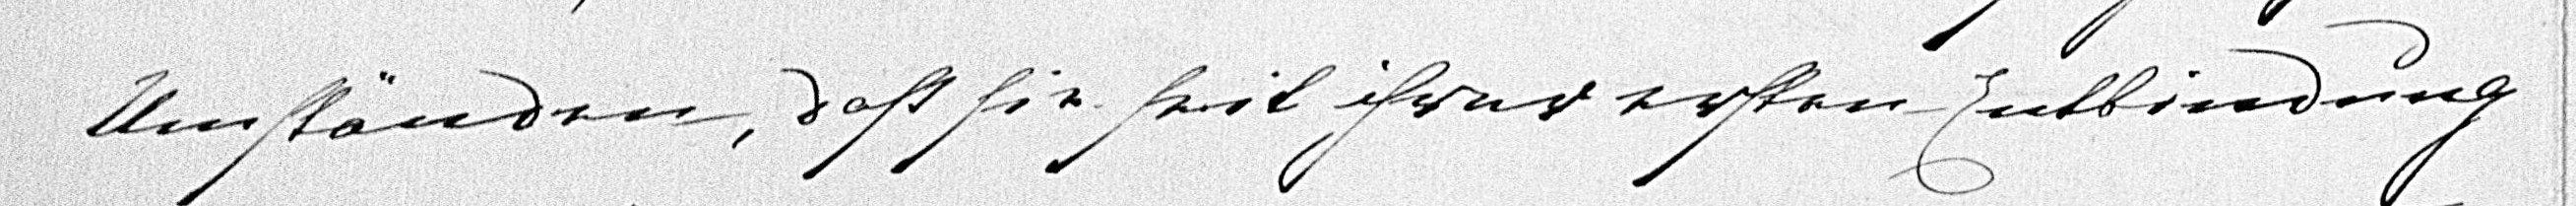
Umständen, daß sie seit ihrer ersten Entbindung
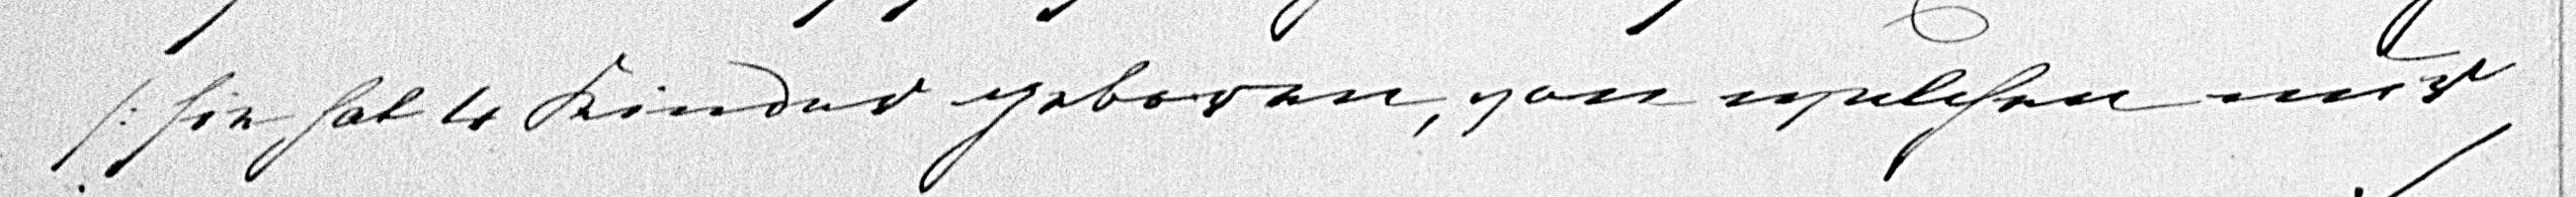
/:sie hat 4 Kinder geboren, von welchen nur
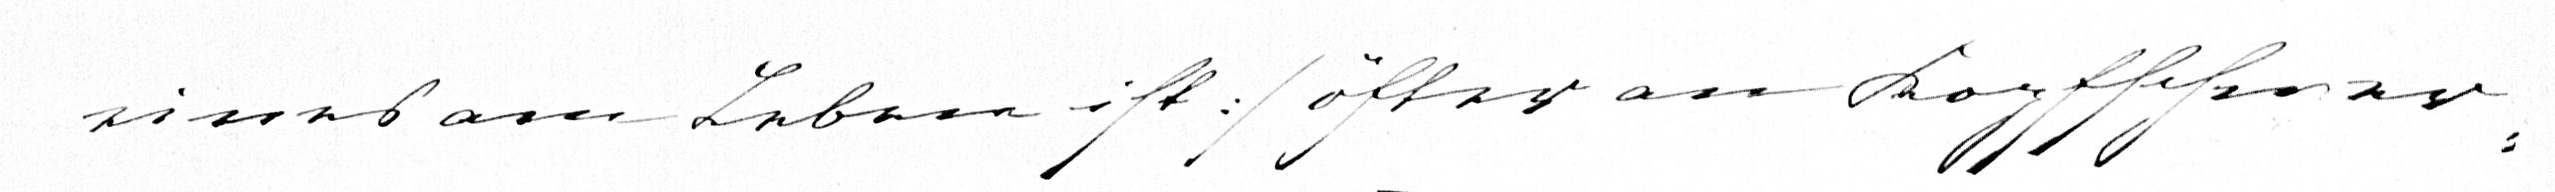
eines am Leben ist:/ öfter an Kopfschwer¬
